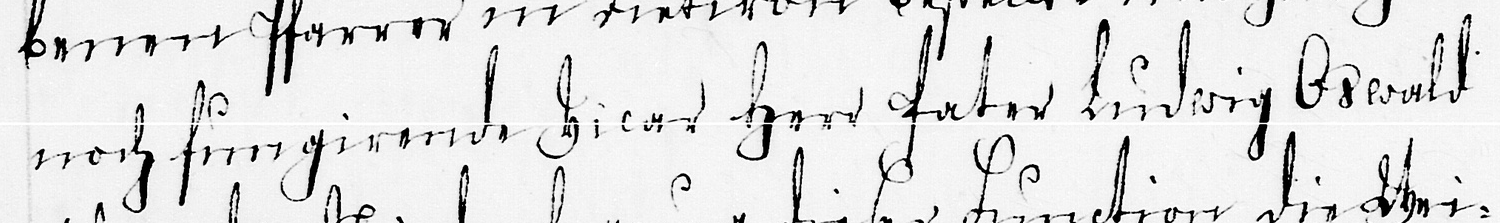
noch fungirende Vicar Herr Pater Ludwig Oswald
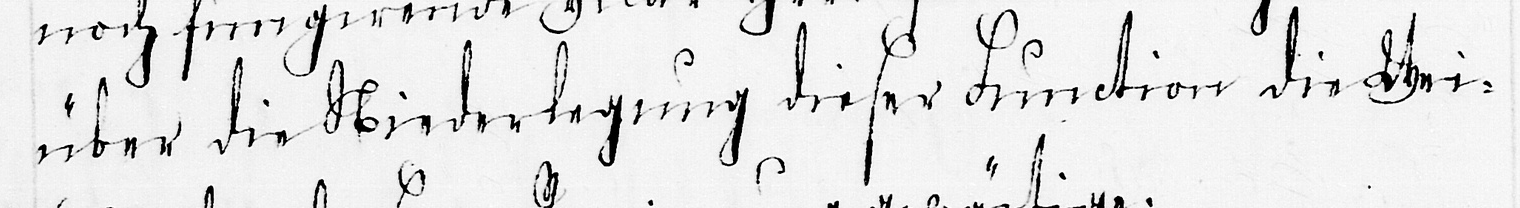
über die Niederlegung dieser Function die Wei¬
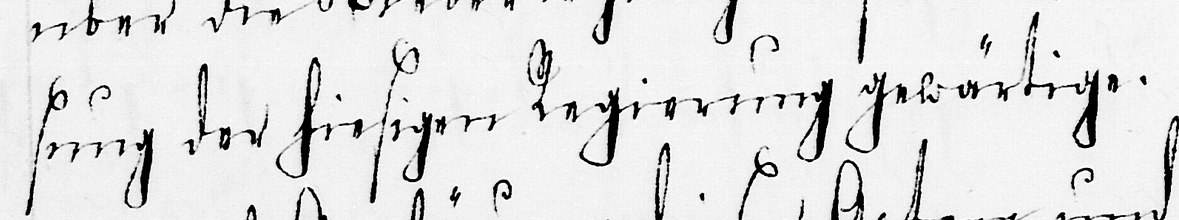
sung der hiesigen Regierung gewärtige.
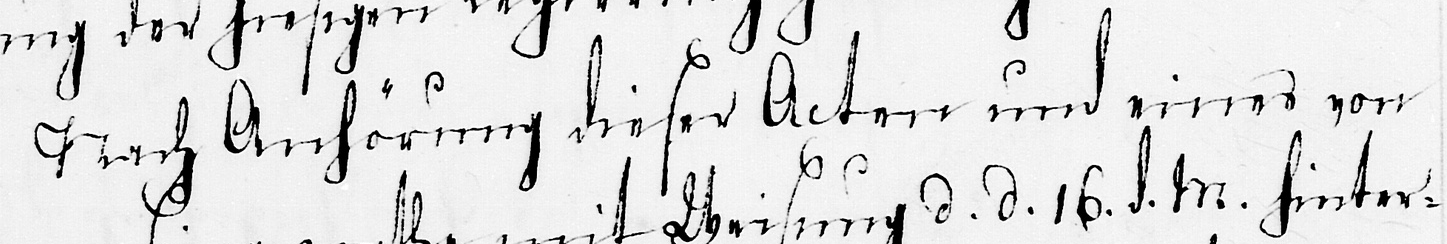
Nach Anhörung dieser Acten und eines von
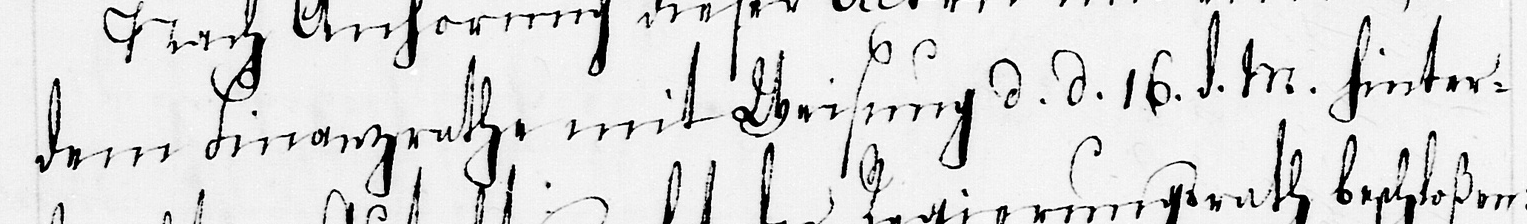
dem Finanzrathe mit Weisung d. d. 16. d. M. hinter¬
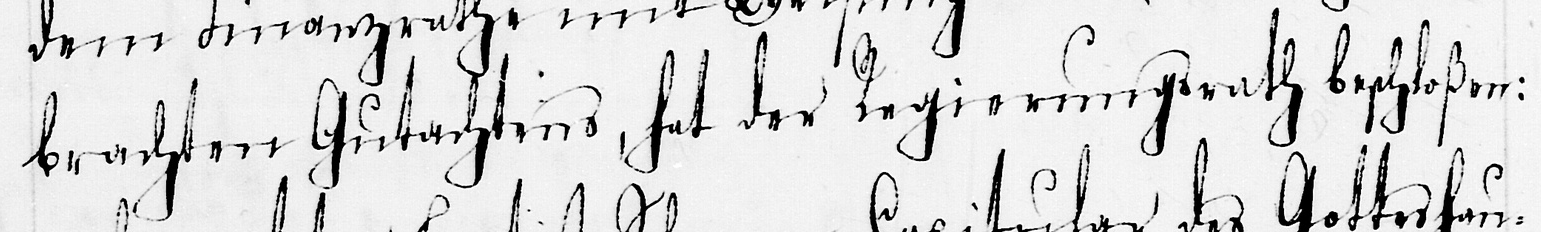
brachten Gutachtens, hat der Regierungsrath beschloßen:
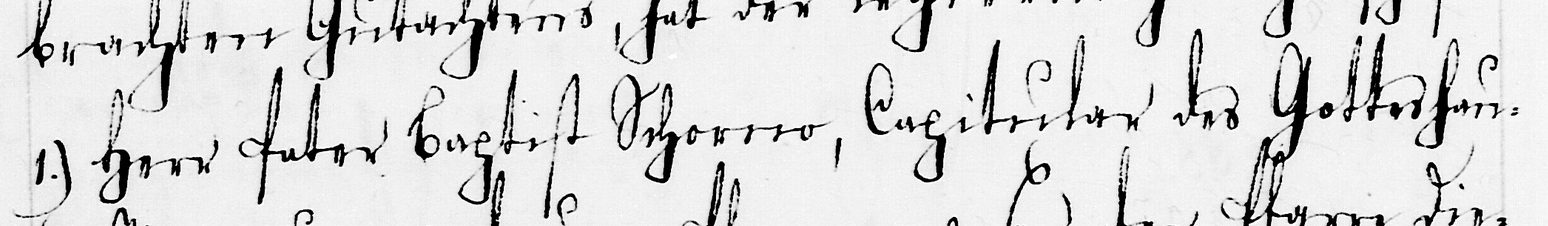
1.) Herr Pater Baptist Schorno, Capitular des Gotteshau¬
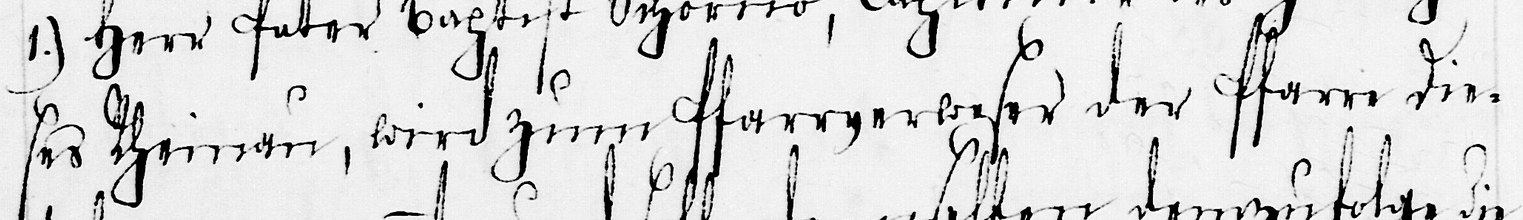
ses Rheinau, wird zum Pfarrverweser der Pfarre Die¬
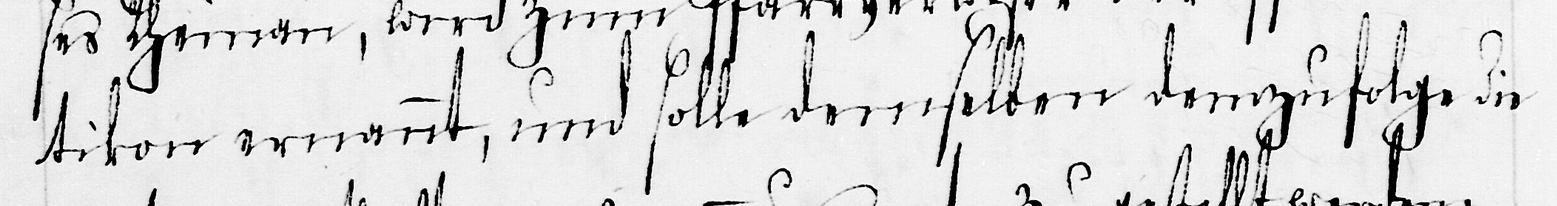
tikon ernannt, und solle demselben demzufolge die
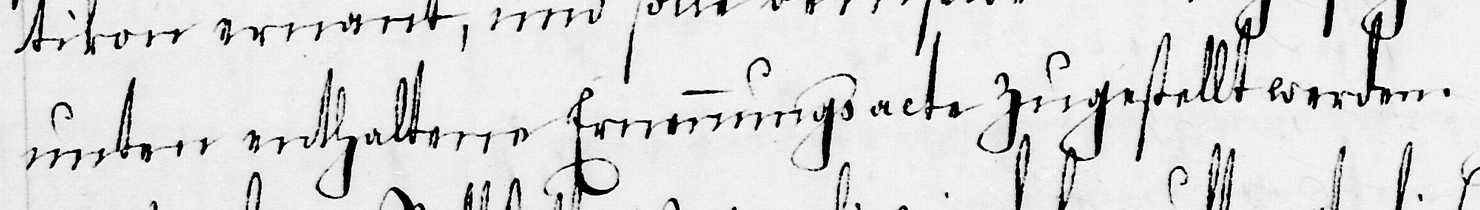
unten enthaltene Ernennungsacte zugestellt werden.
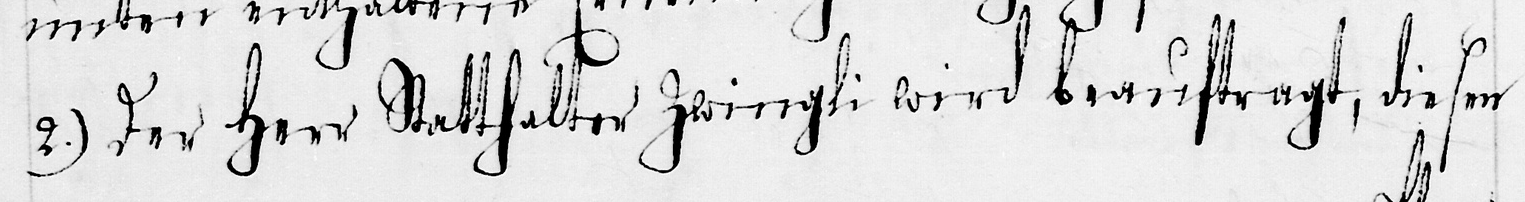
2.) Der Herr Statthalter Zwingli wird beauftragt, diesen
